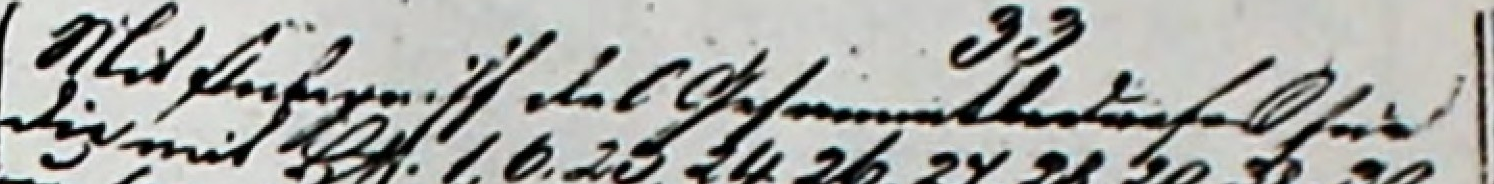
Mit Inbegriff des Gesammtbedarfes für
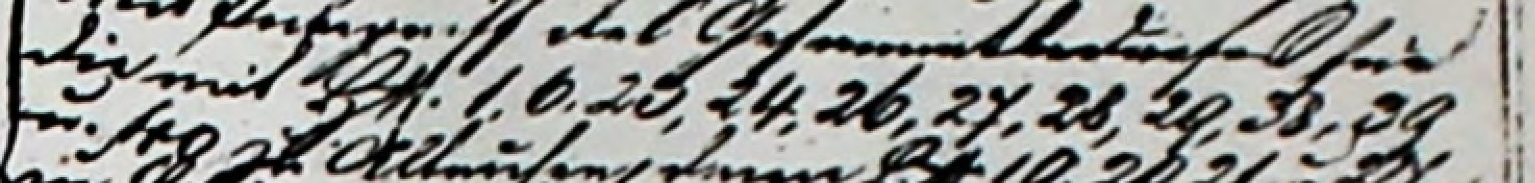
die mit H? 1, 6, 23, 24, 26, 27, 28, 29, 38, 39
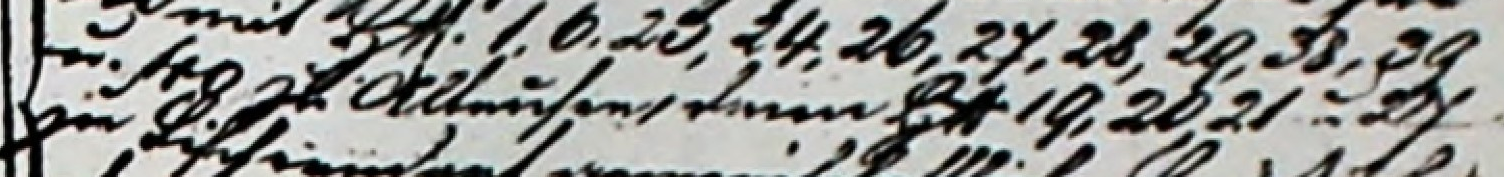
u. Fro zu Altaussee, denn H? 19, 20, 21 u 27
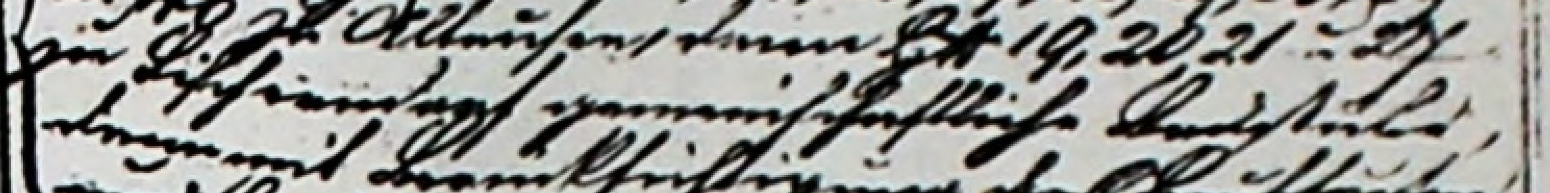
zu Fischerndorf gemeinschaftliche Badstuben,
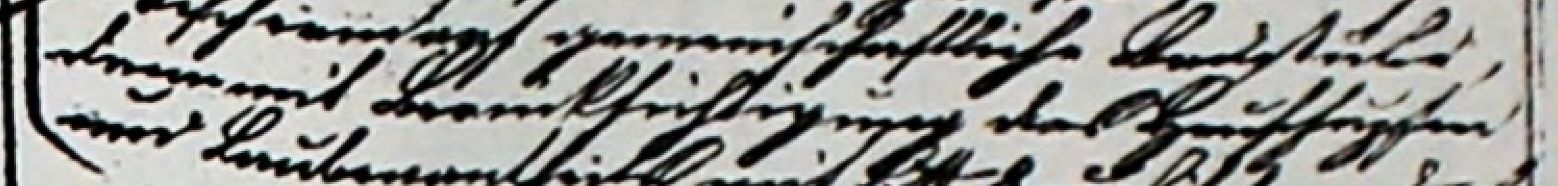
denn mit Berücksichtigung des Hauschupsen
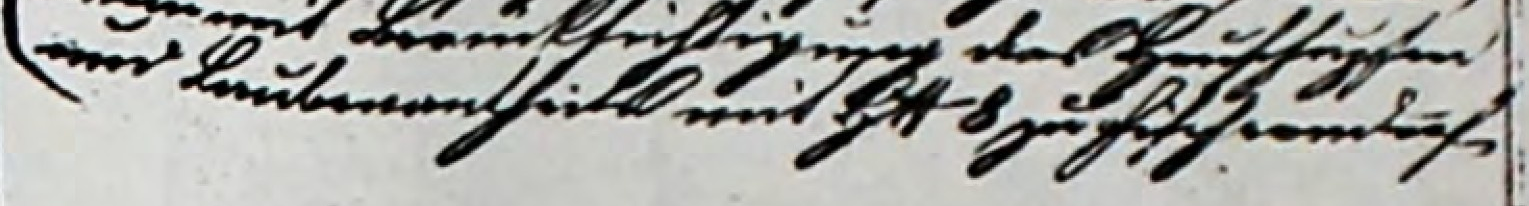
und Laubenanthuts mit H? 8 zu glisch???
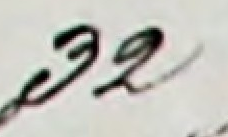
32
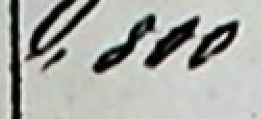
0,800
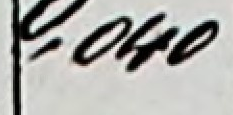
0,040
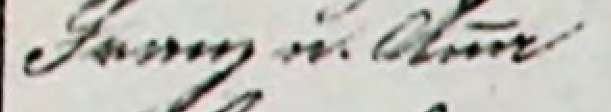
Franz u. Anna
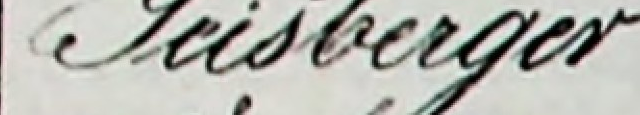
Geisberger
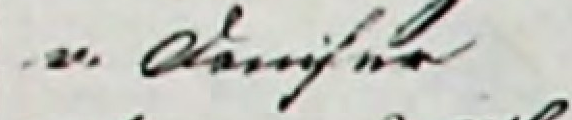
v. Danifer
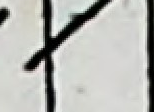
7
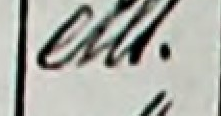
Alt„
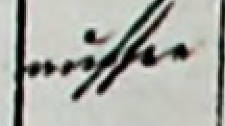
aussee
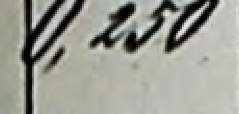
0,250
